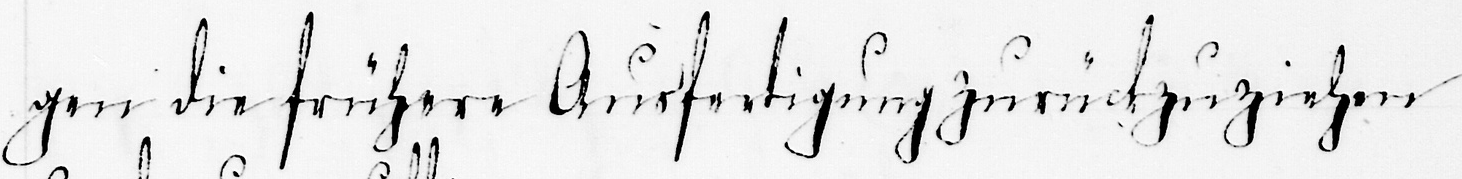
gen die frühere Ausfertigung zurückzuziehen
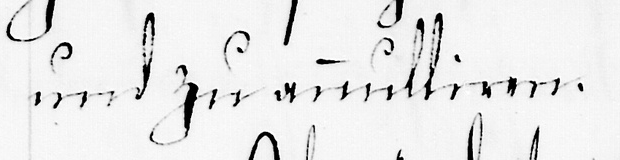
und zu annulliren.
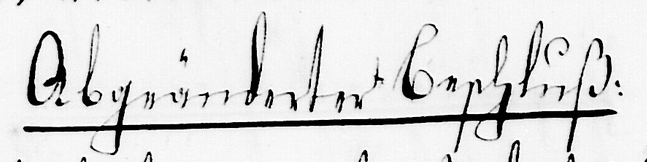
Abgeänderter Beschluß:
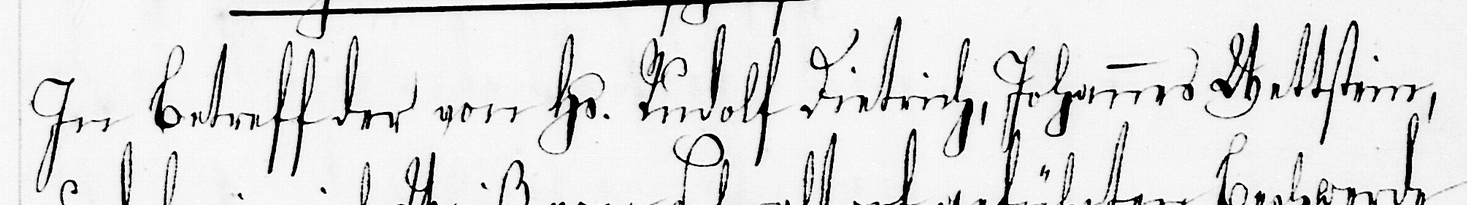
In Betreff der Hs. Rudolf Dietrich, Johannes Wettste¬
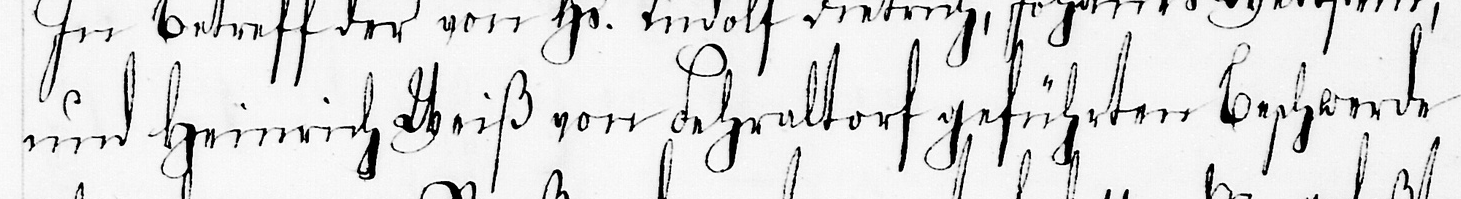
und Heinrich Weiß von Fehraltorf geführten Beschwerde
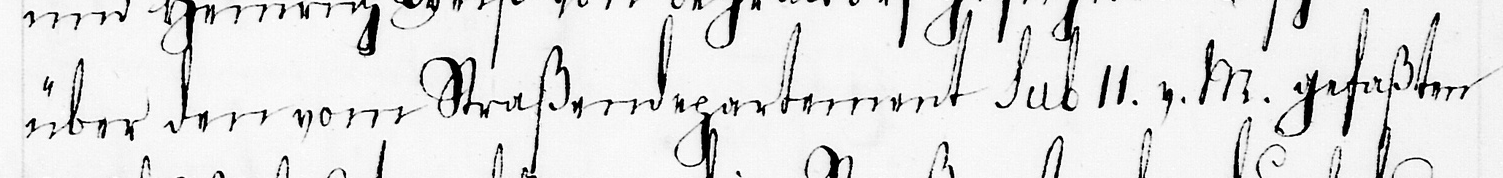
über den vom Straßendepartement sub 11. v. M. gefaßten
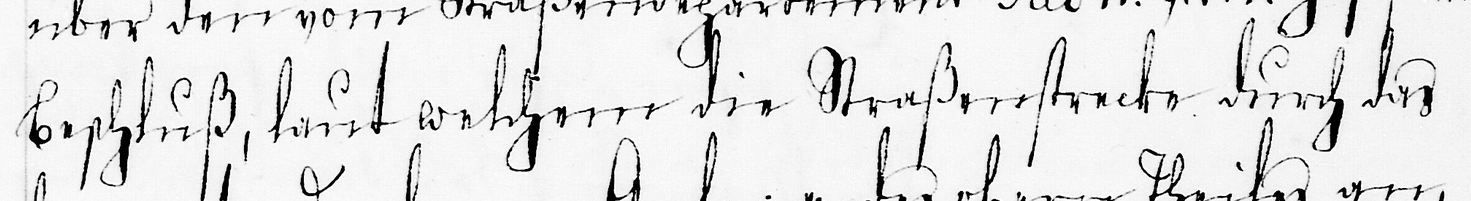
Beschluß, laut welchem die Straßenstrecke durch das
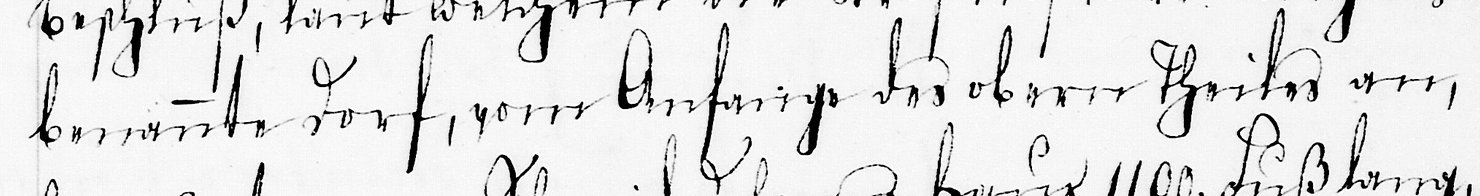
benannte Dorf, vom Anfange des obern Theiles an,
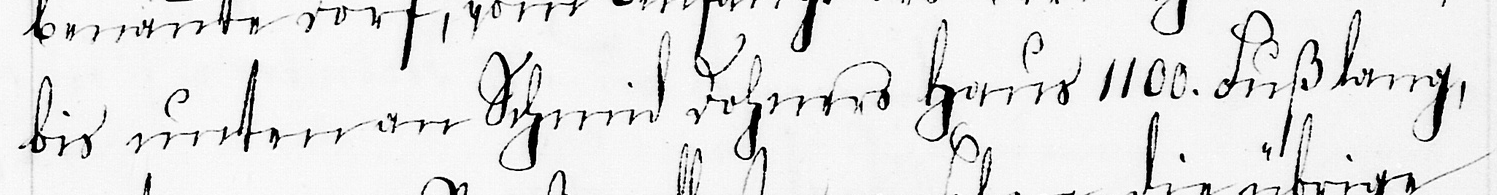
bis unten an Schmid Dohners Haus 1100. Fuß lang,
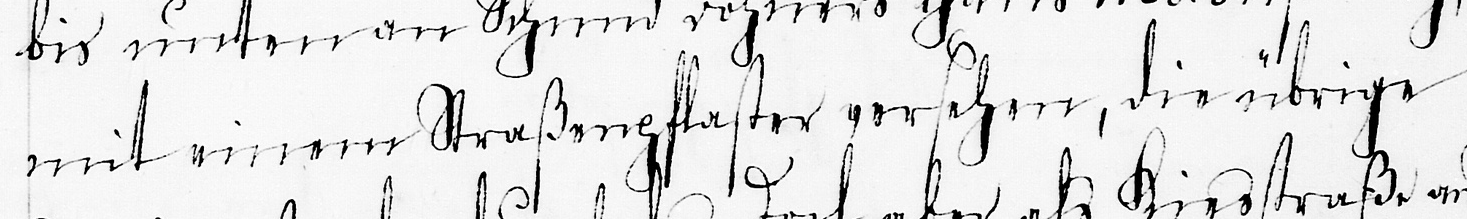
mit einem Straßenpflaster versehen, die übrige
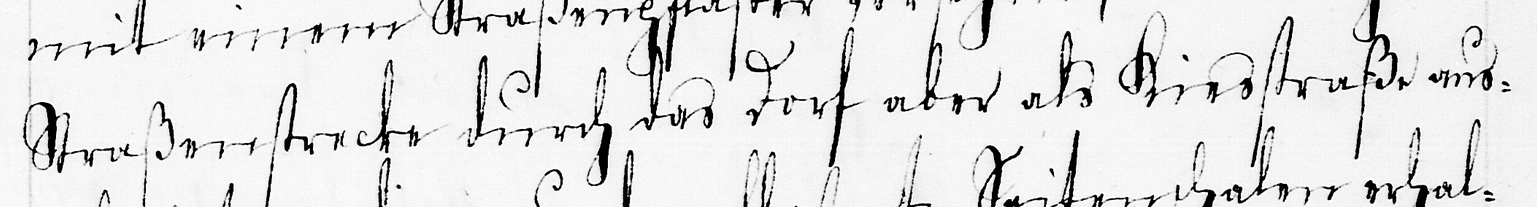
Straßenstrecke durch das Dorf aber als Kiesstraße aus¬
